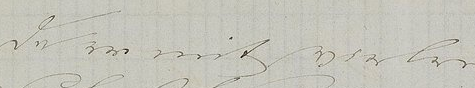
da er mit vielen
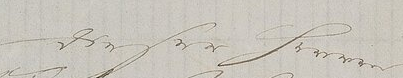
dieser Herren
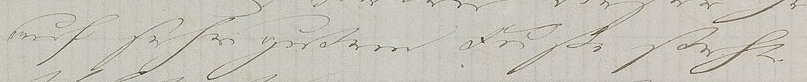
auf sehr gutem Fuße steht.
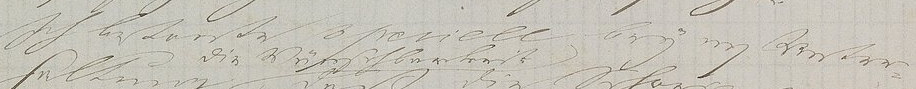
Ich betonte speciell bey m. Unter-
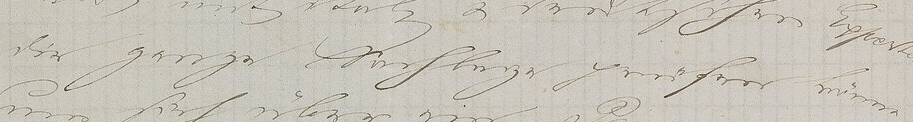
die ganze Sachlage prüfen könne,
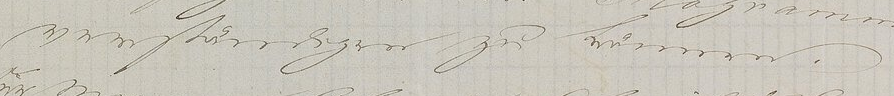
verständigen zu können.
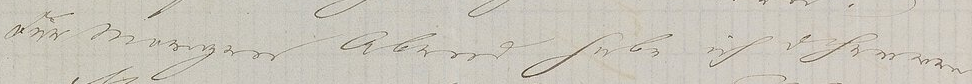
Für morgen Abend habe ich d Herren
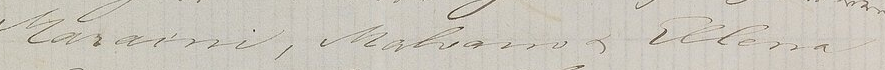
Maraini, Malvano & Ellena
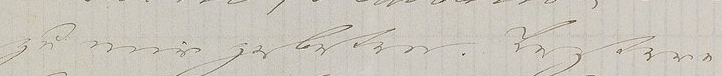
zu mir gebeten. Leztere
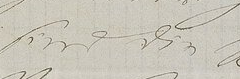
sind die
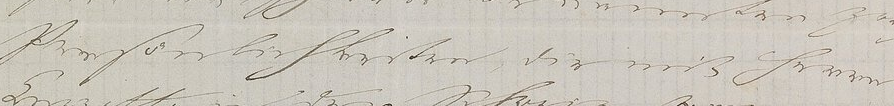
Persönlichkeiten, die mit Herrn
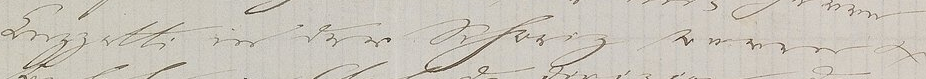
Luzzati in der Schweiz waren &
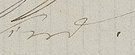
sind.
